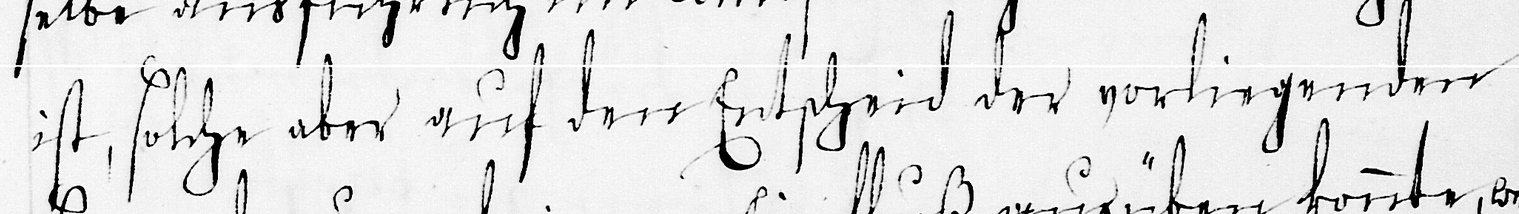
ist, solche aber auf den Entscheid der vorliegenden
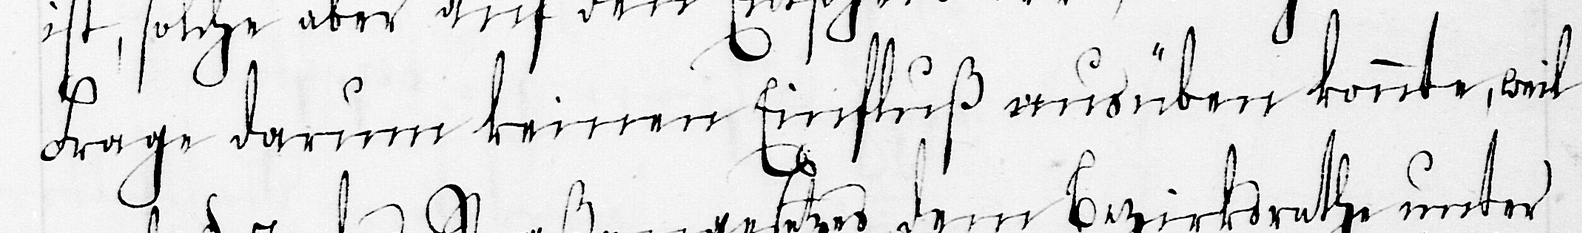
Frage darum keinen Einfluß ausüben konnte, weil
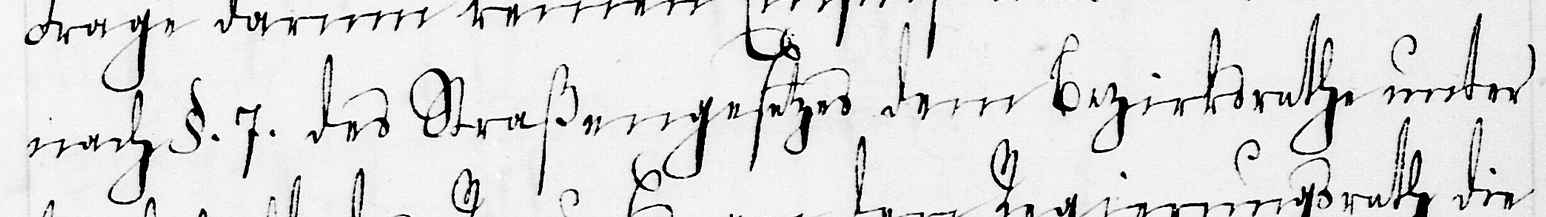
nach §. 7. des Straßengesetzes dem Bezirksrathe unter
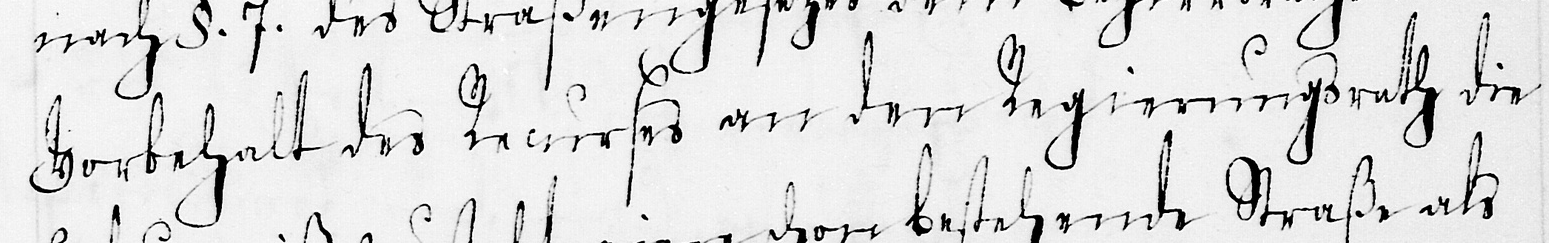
Vorbehalt des Recurses an den Regierungsrath die
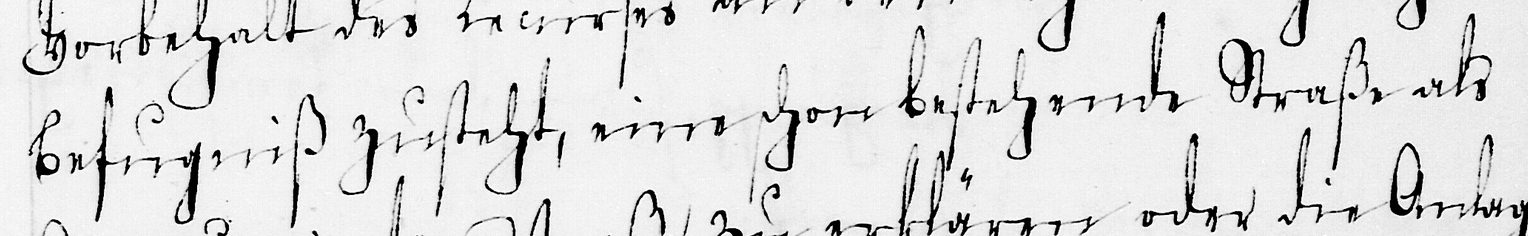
Befugniß zusteht, eine schon bestehende Straße als
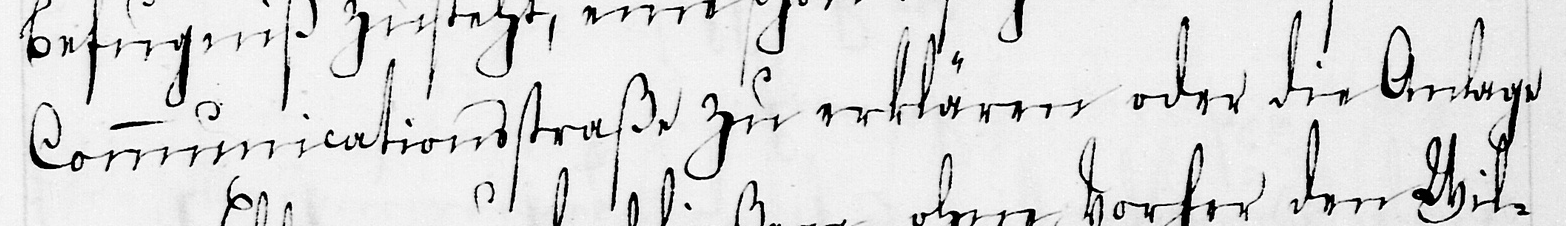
Communicationsstraße zu erklären oder die Anlage
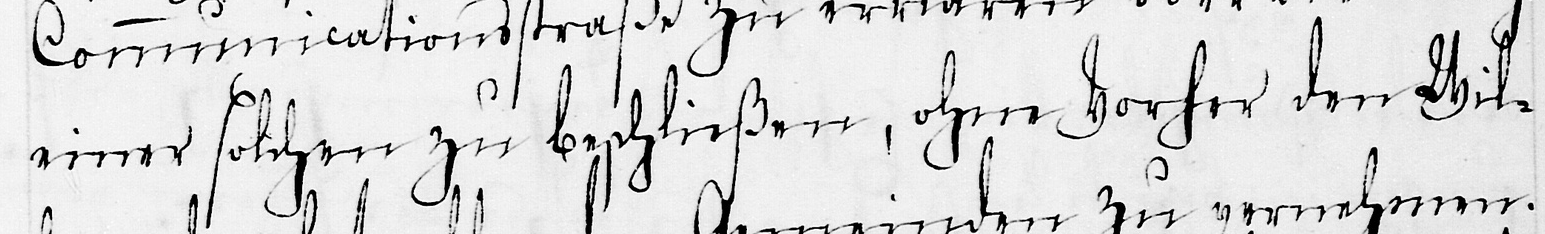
einer solchen zu beschließen, ohne Vorher den Wil¬
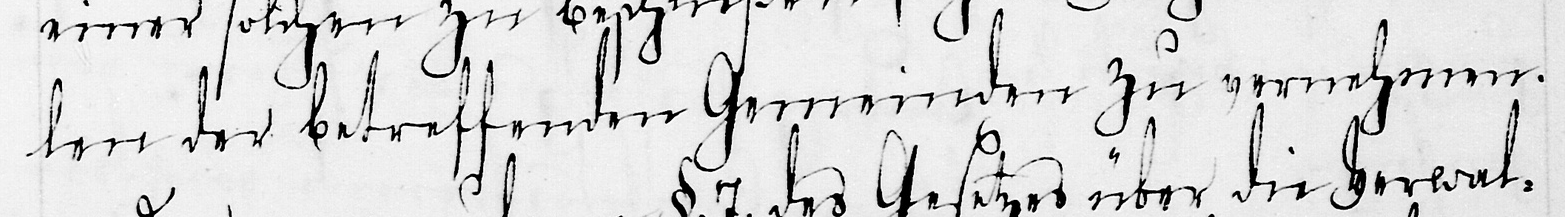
len der betreffenden Gemeinden zu vernehmen.
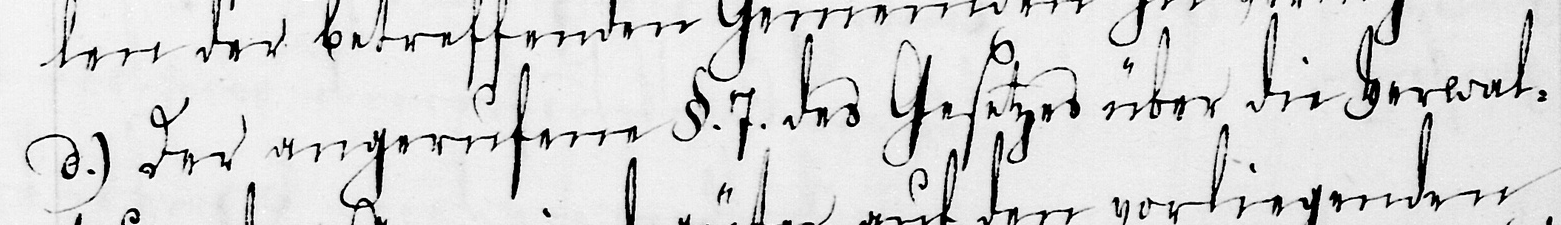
d.) Der angerufene §. 7. des Gesetzes über die Verwal¬
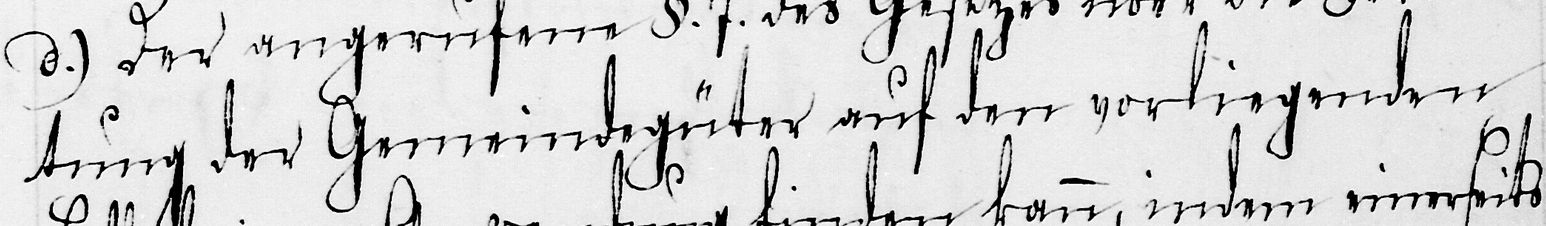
tung der Gemeindegüter auf den vorliegenden
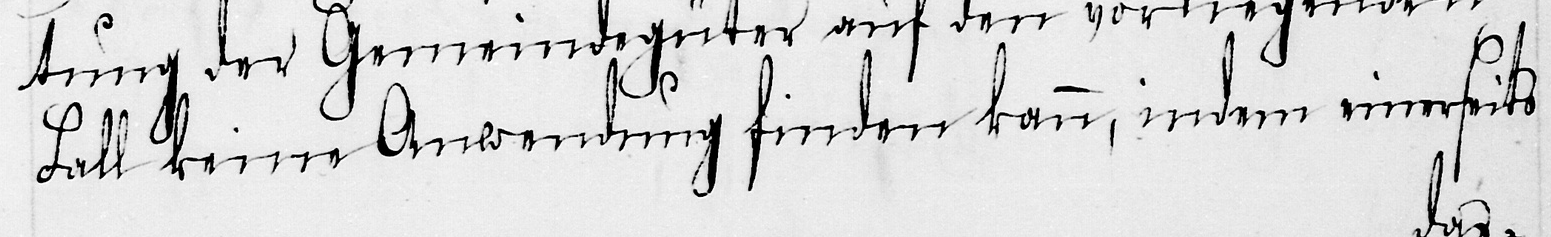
Fall keine Anwendung finden kann, indem einerseits
